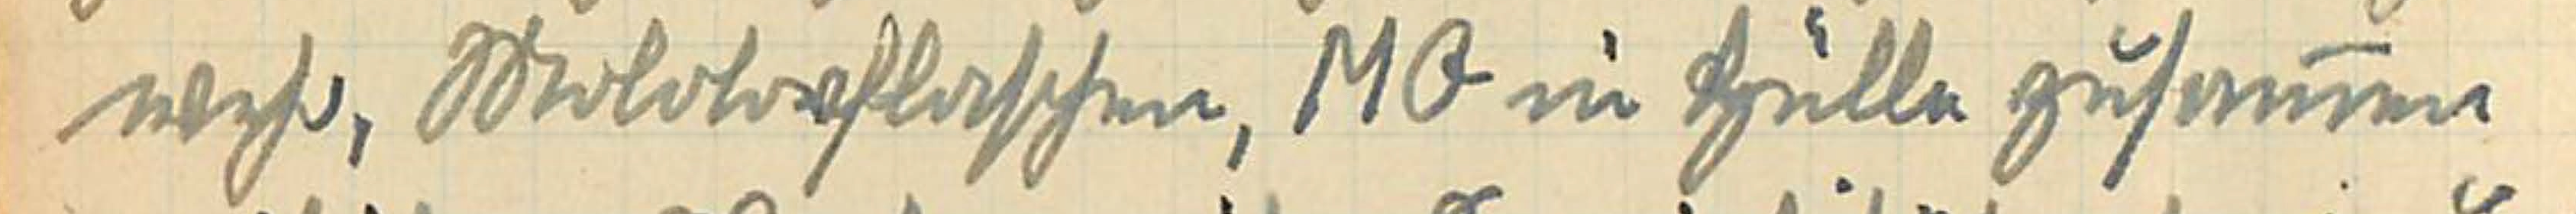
wehr, Molotovflaschen, MG in Hülle zusammen
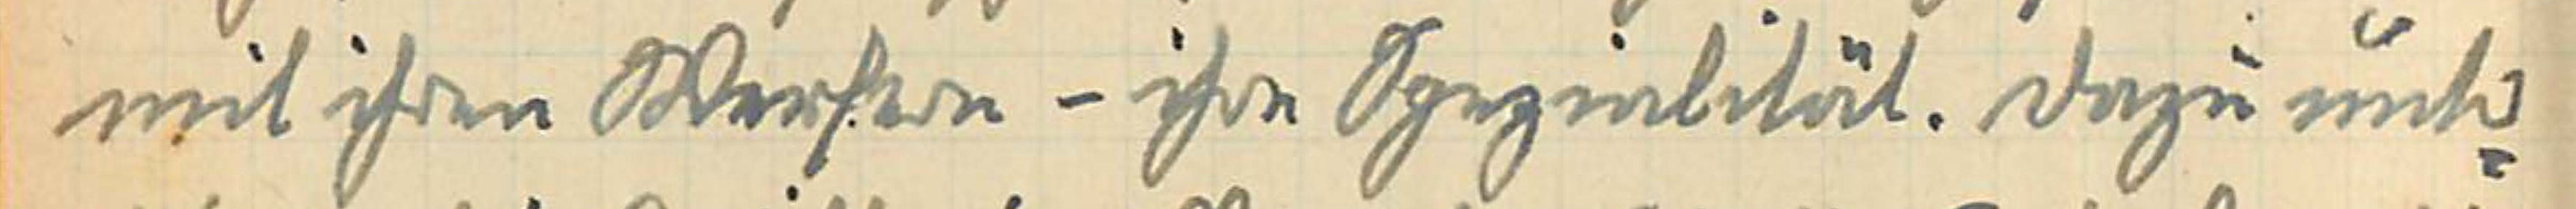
mit ihren Werfern – ihre Spezialität. Dazu unter-
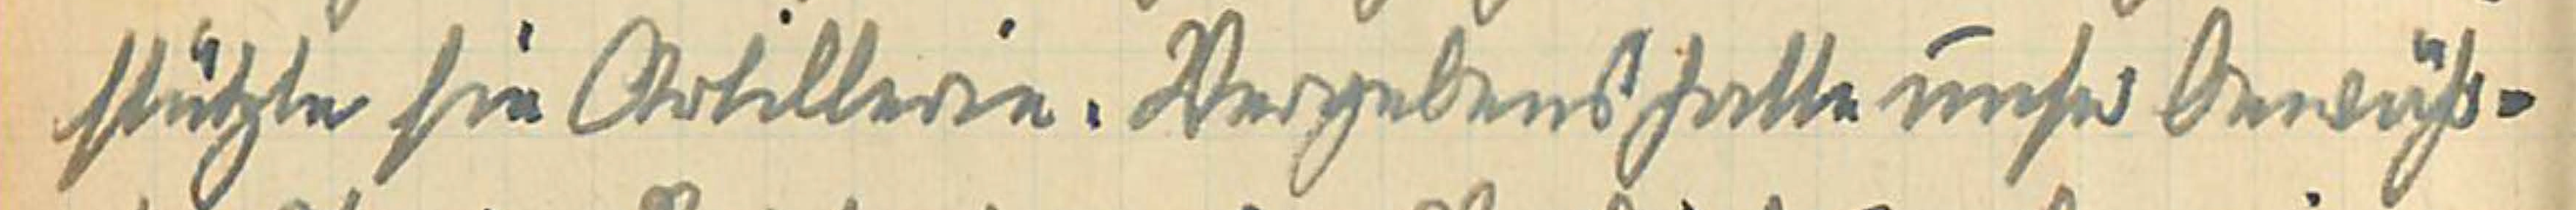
stützte sie Artillerie. Vergebens hatte unser bewuß-
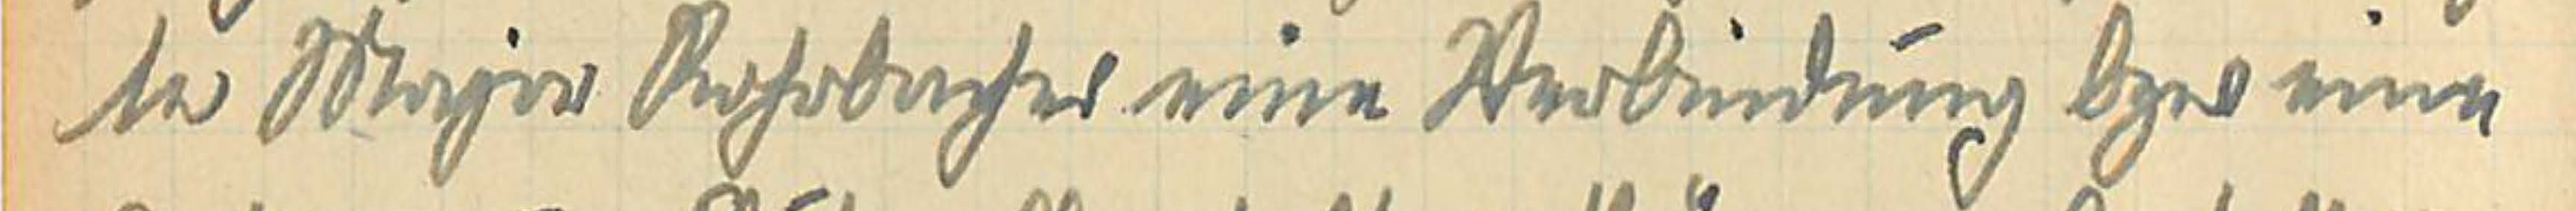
ter Major Rohrbacher eine Verbindung bzw. eine
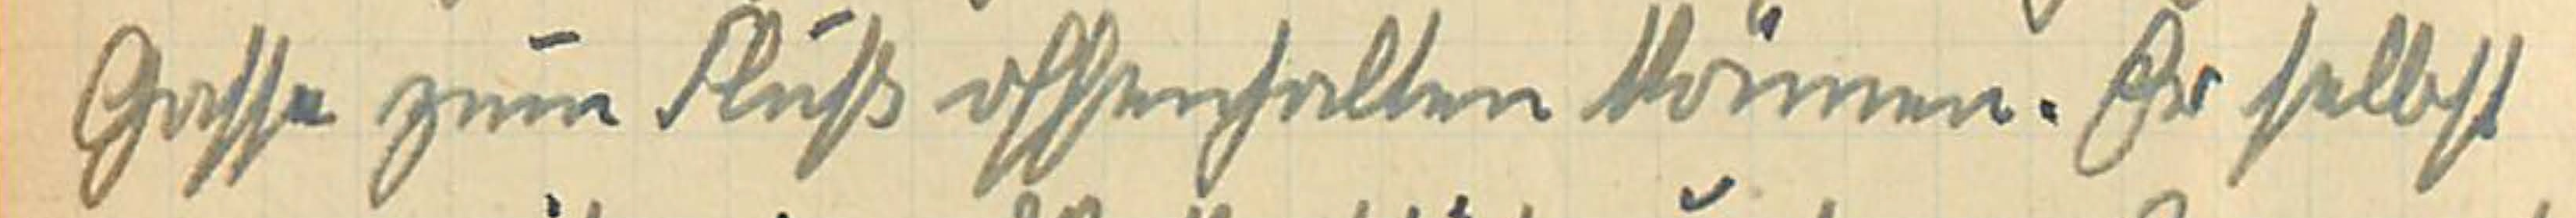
Gasse zum Fluß offenhalten können. Er selbst
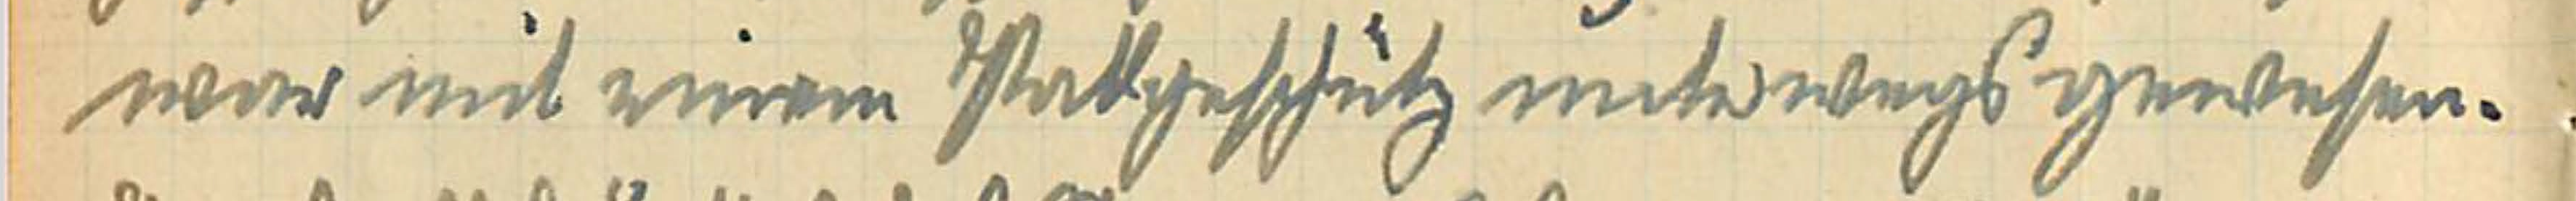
war mit einem Pakgeschütz unterwegs gewesen.
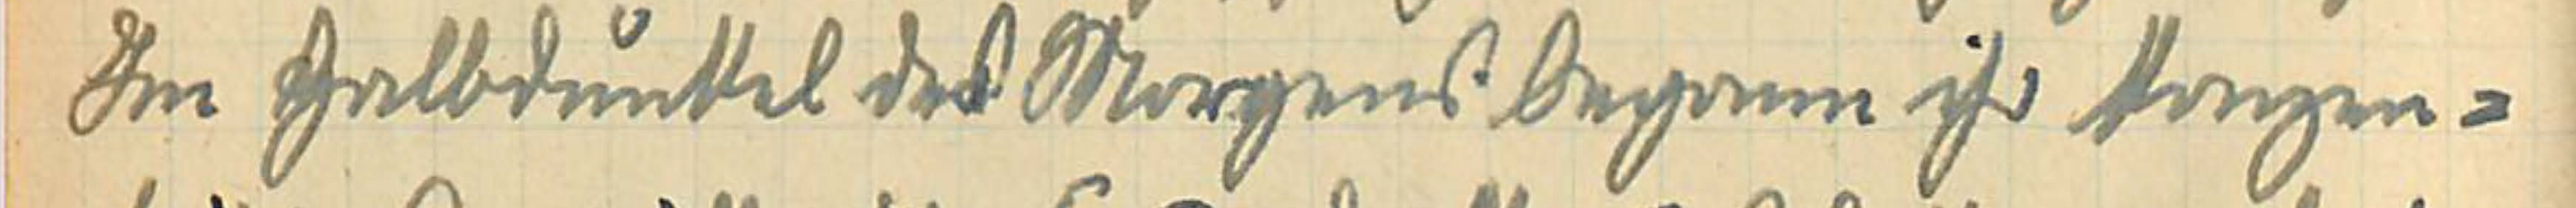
Im Halbdunkel des Morgens begann ihr konzen-
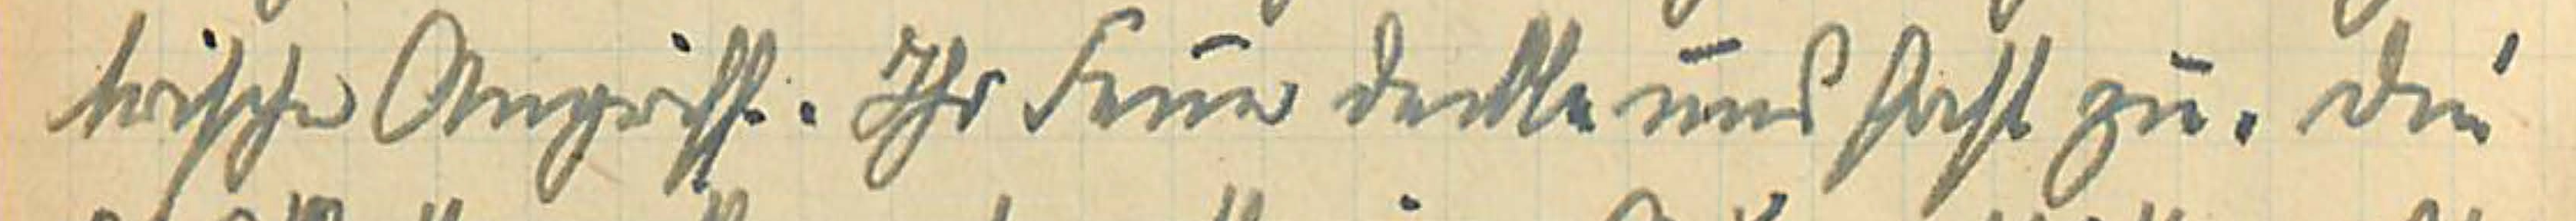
trischer Angriff. Ihr Feuer deckte uns fast zu. Die
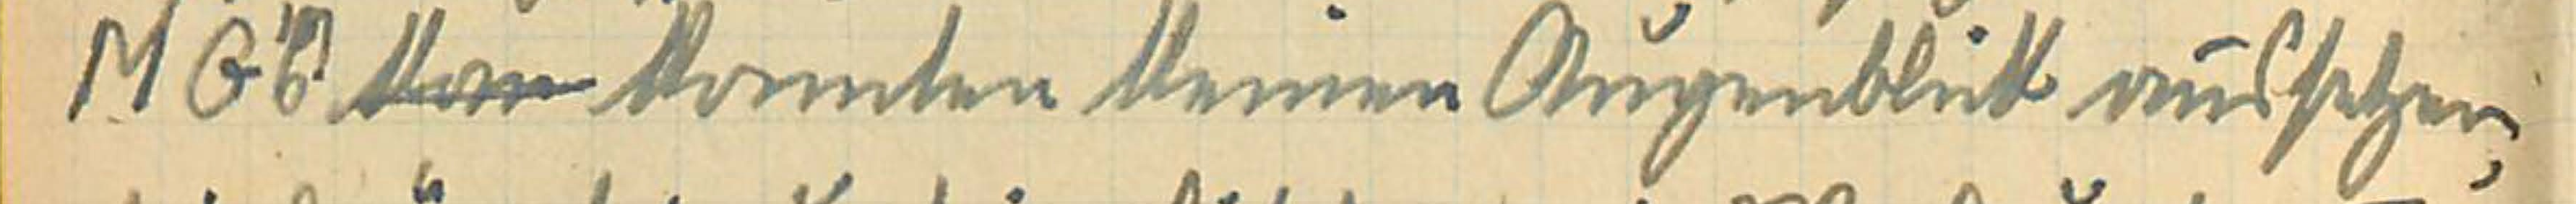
MG's kom konnten keinen Augenblick aussetzen,
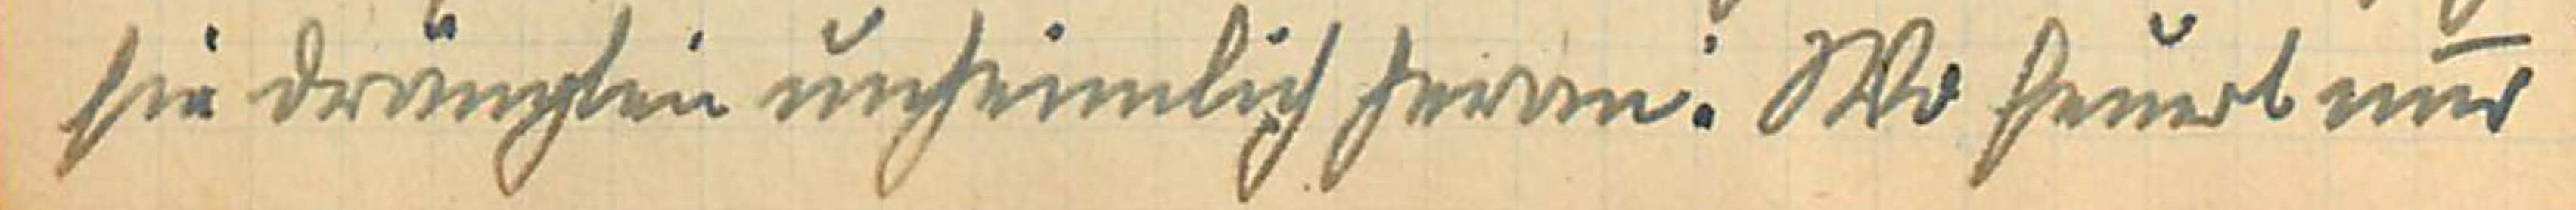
sie drängten unheimlich heran. Wo feuert nur
